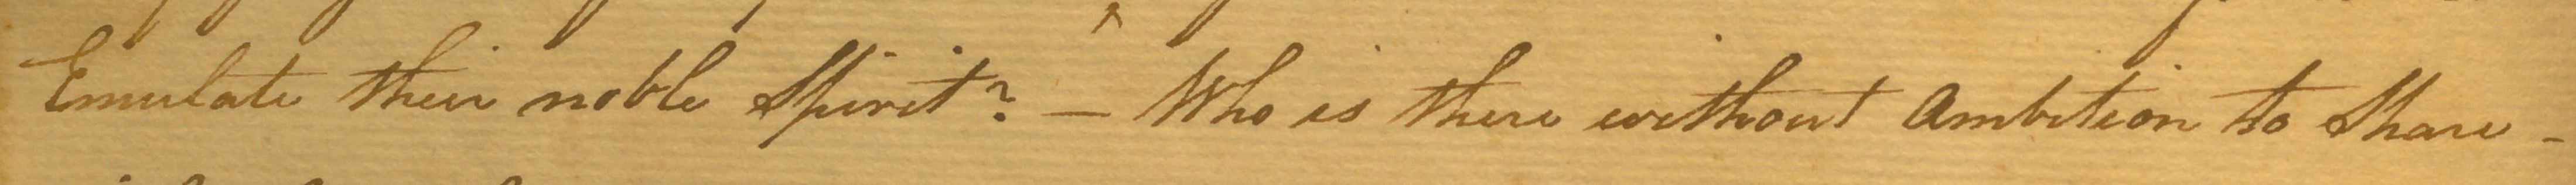Emulate their noble Spirit?- Who is there without Ambition to Share-
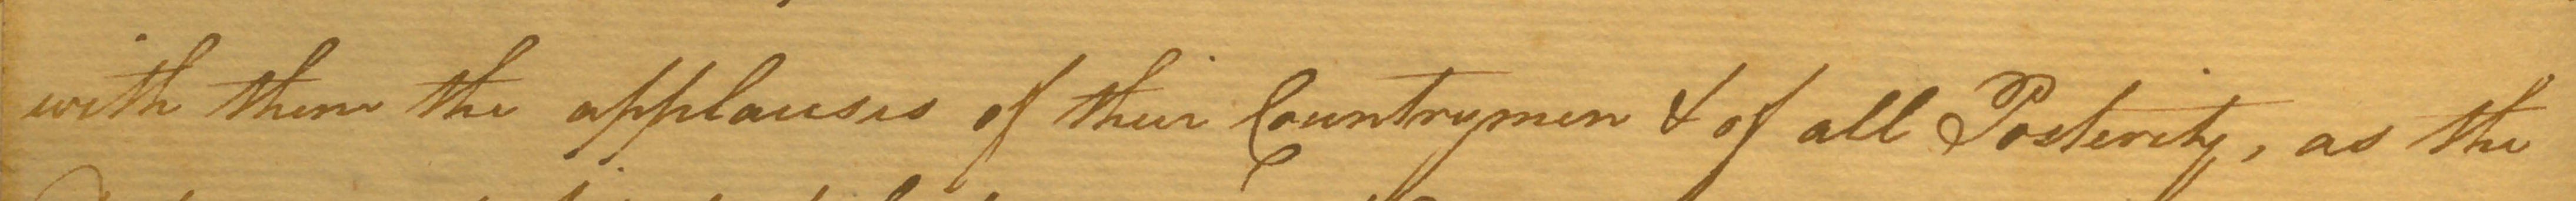with them the applauses of their Countrymen & of all Posterity, as the
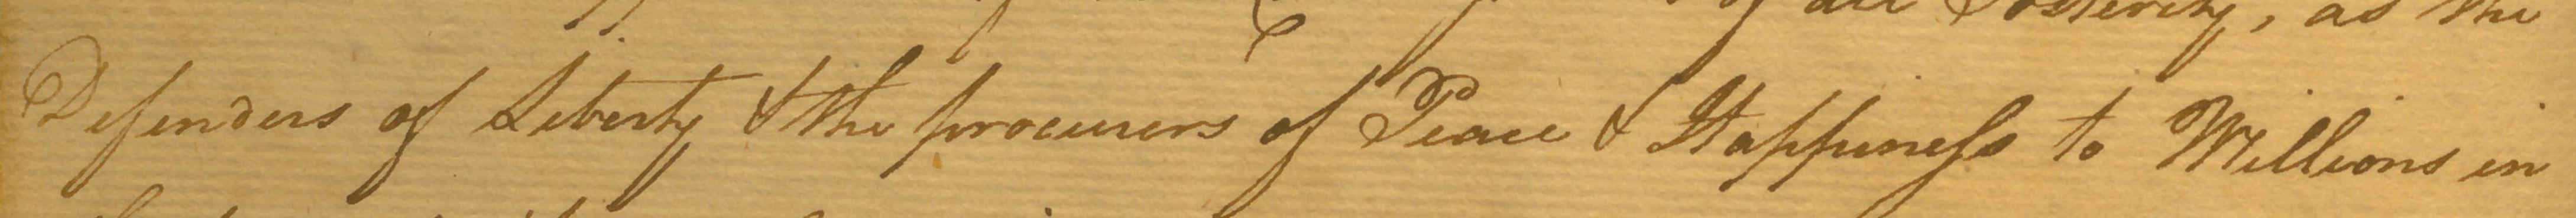Defenders of Liberty & the procurers of Peace & Happiness to Millions in
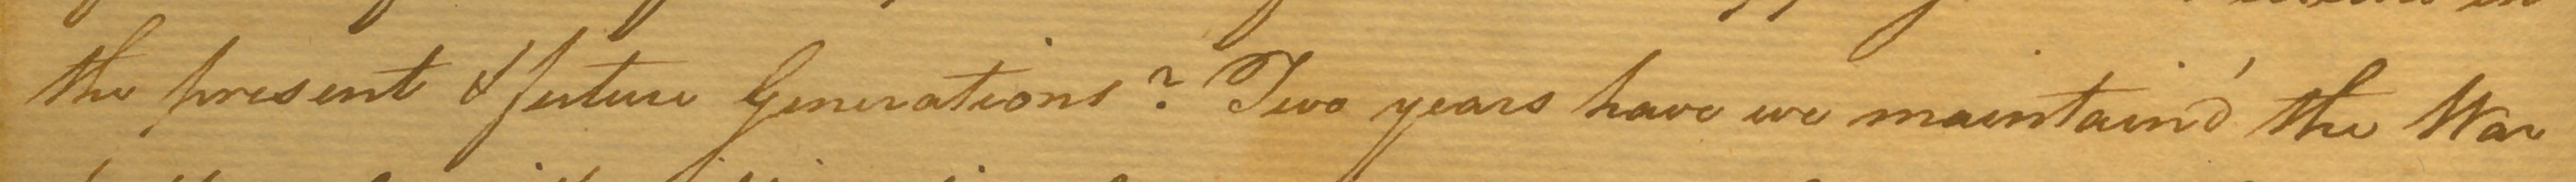the present & future Generations? Two years have we maintain'd the War
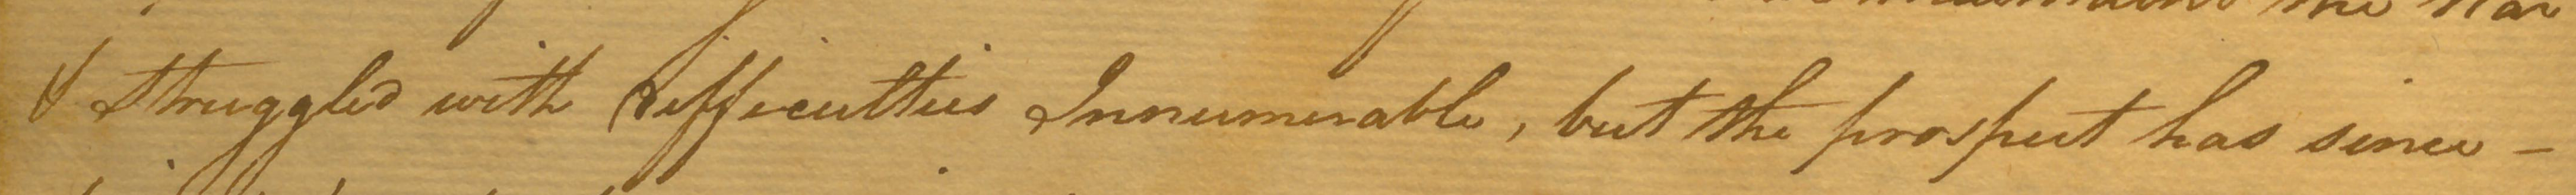& struggled with difficulties Innumerable, but the prospect has since
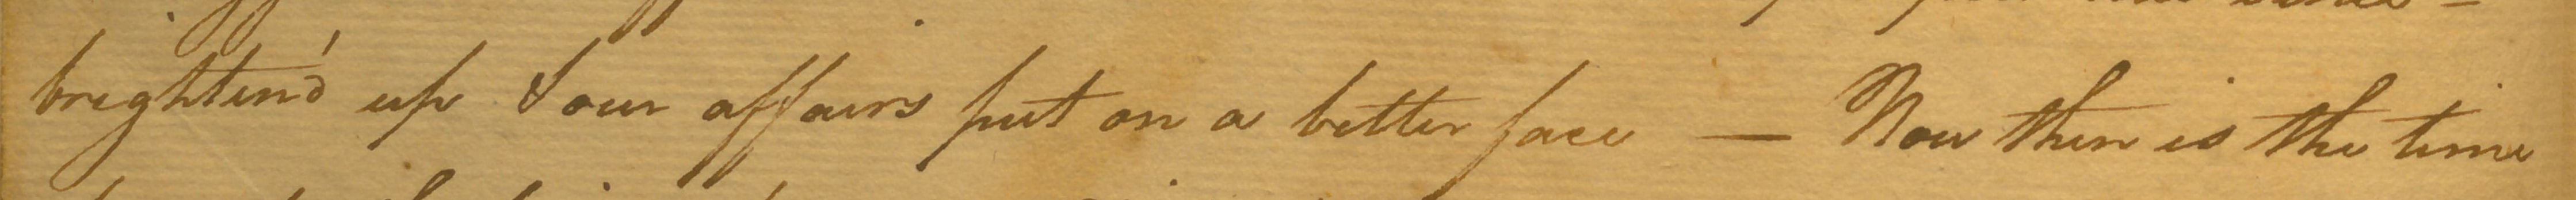brighten'd up & our affairs put on a better face- Now then is the time
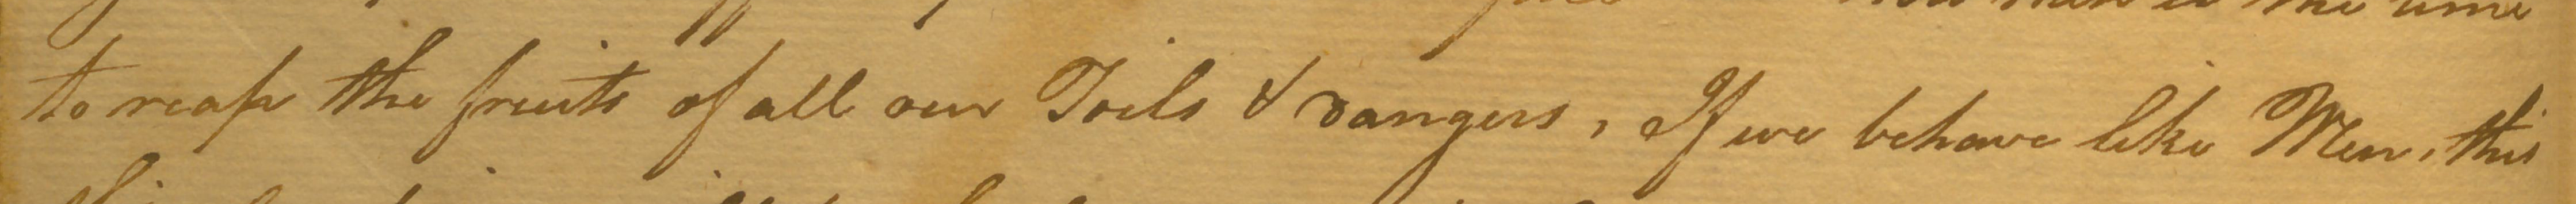to reap the fruits of al our Toils & dangers, If we behave like Men, this
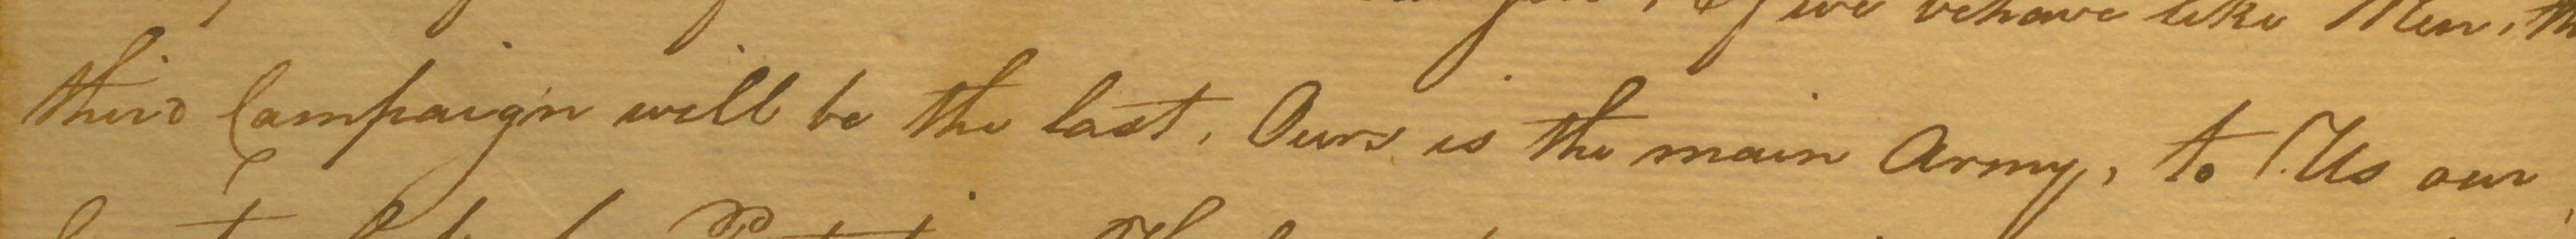third Campaign will be the last, Ours is the main Army, to Us our
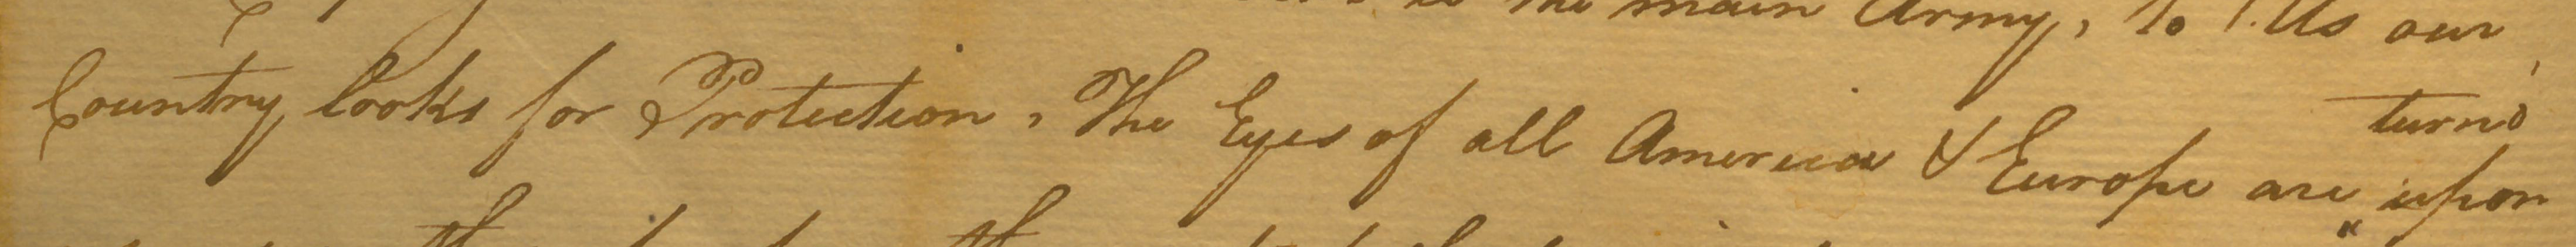Country looks for Protection, The Eyes of all America & Europe are ^ upon
